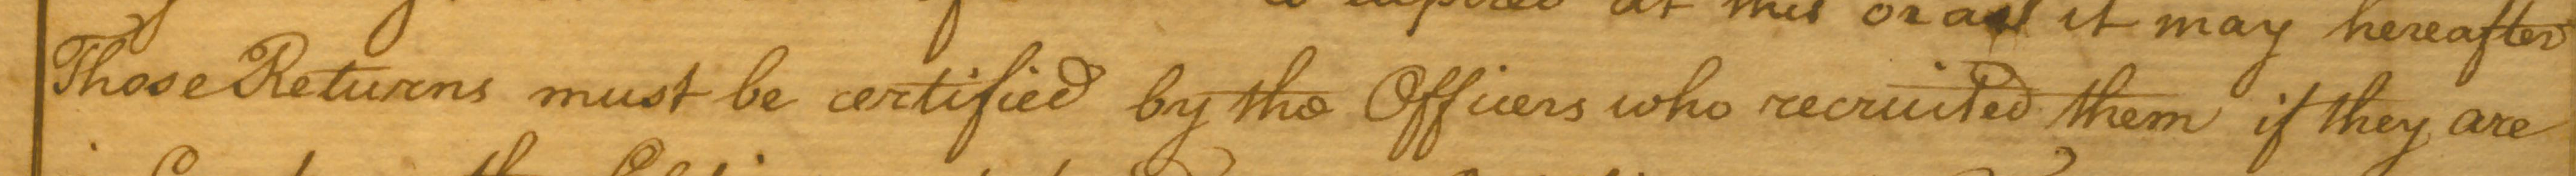Those Returns must be certified by the Officers who recruited them if they are
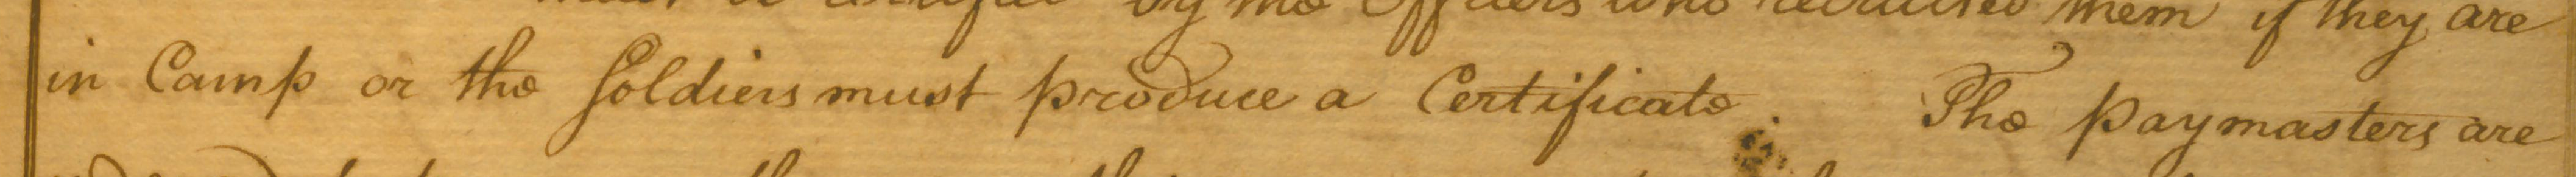in Camp or the soldiers must produce a Certificate. The Paymasters are
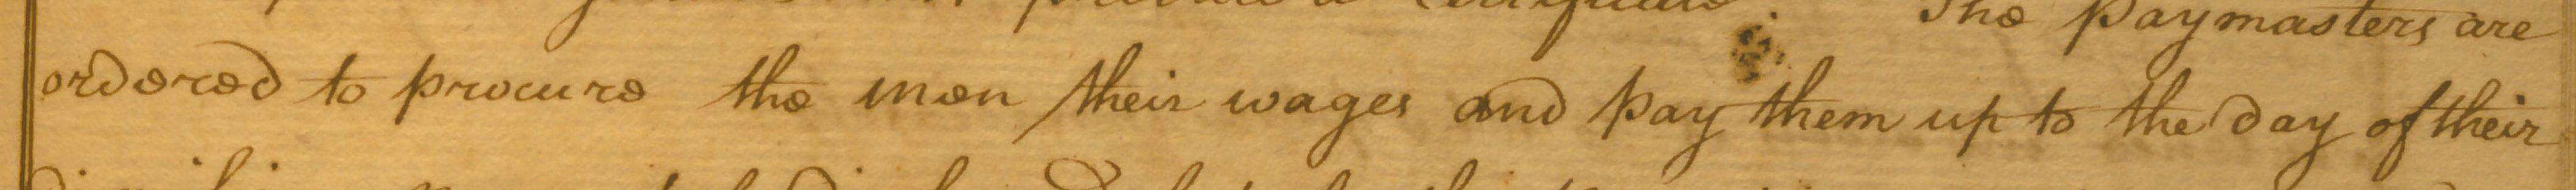ordered to procure the men their wages and pay them up to the day of their
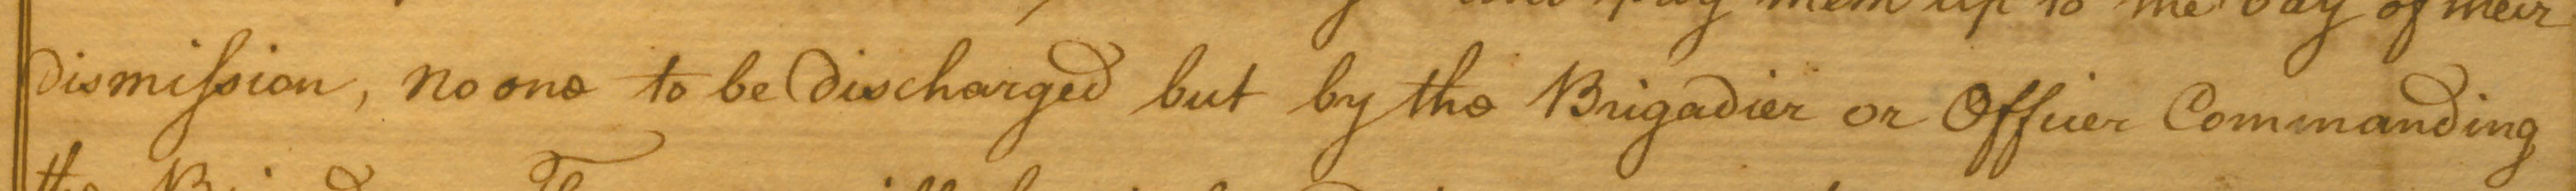dismission, no one to be discharged but by the Brigadier or Officer Commanding
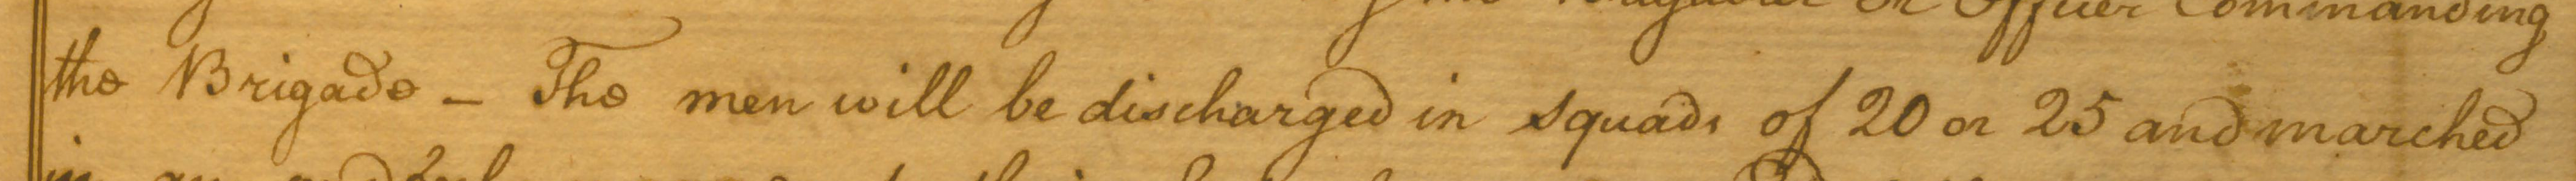the Brigade- The men will be discharged in squads of 20 or 25 and marched
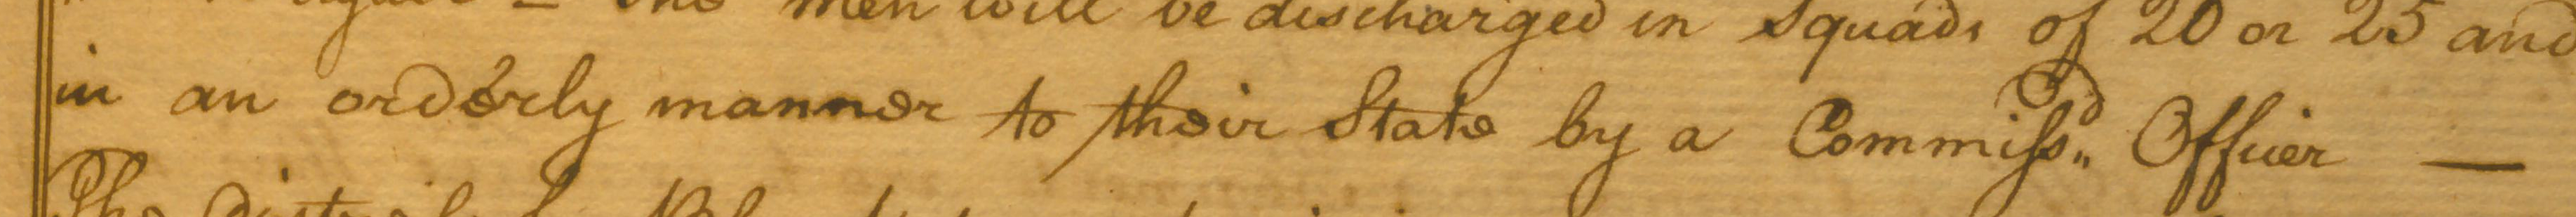in an orderly manner to their State by a Commiss^d. Officer-
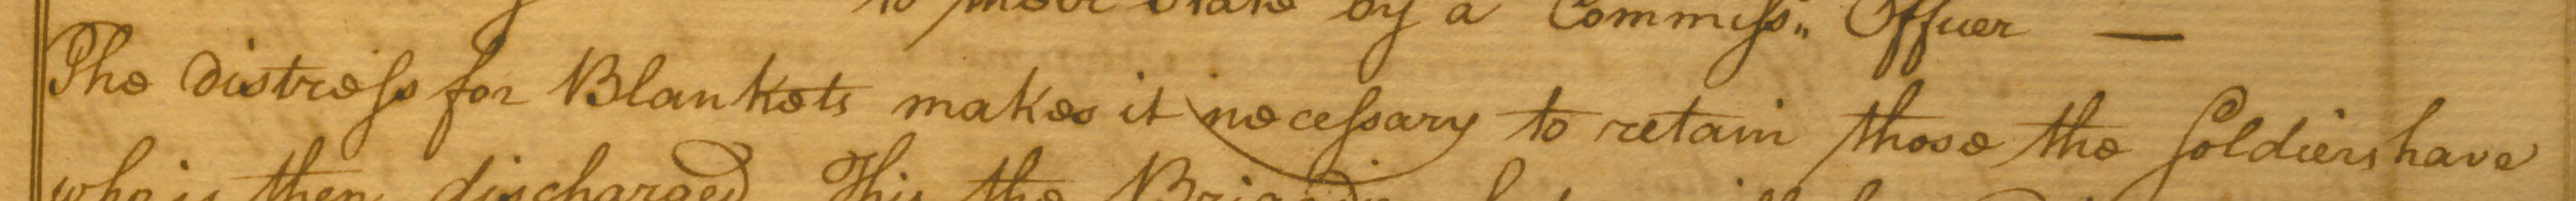The distress for Blankets makes it necessary to retain those the soldiers have
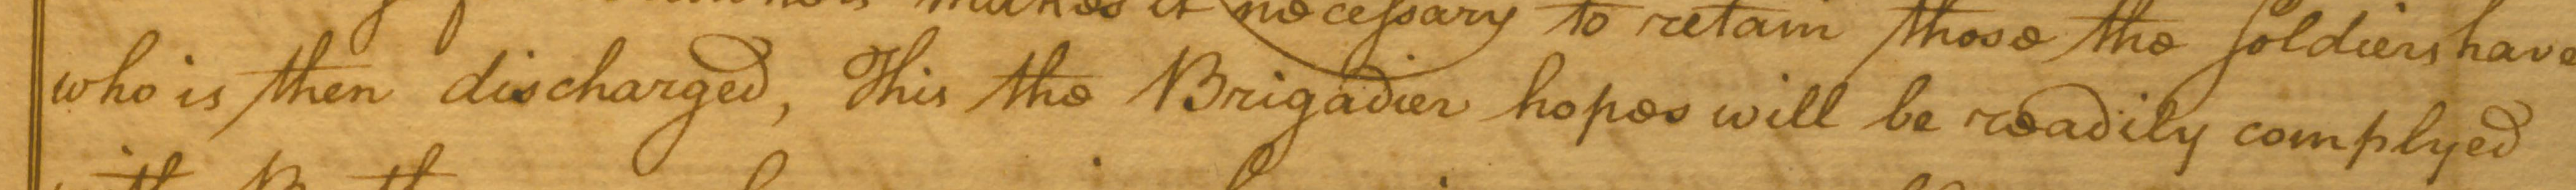who is then discharged, This the Brigadier hopes will be readily complyed
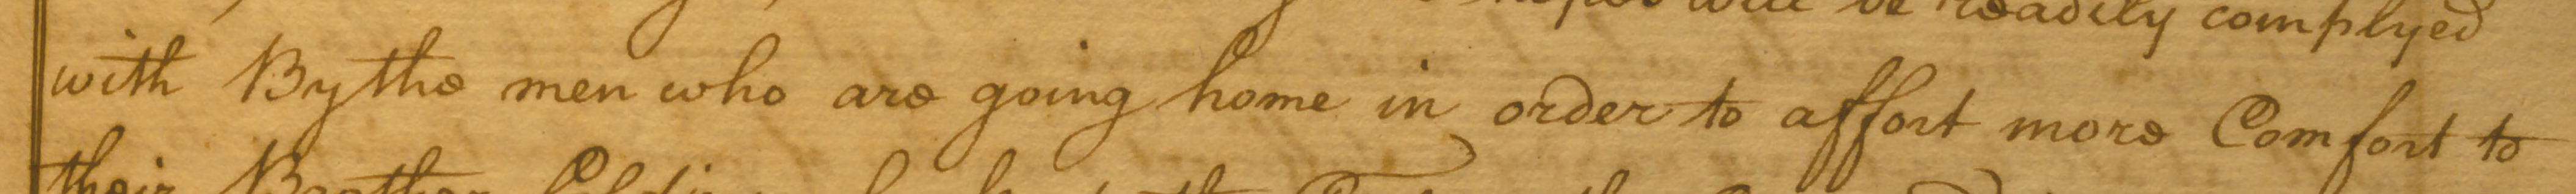with By the men who are going home in order to affort more Comfort to
